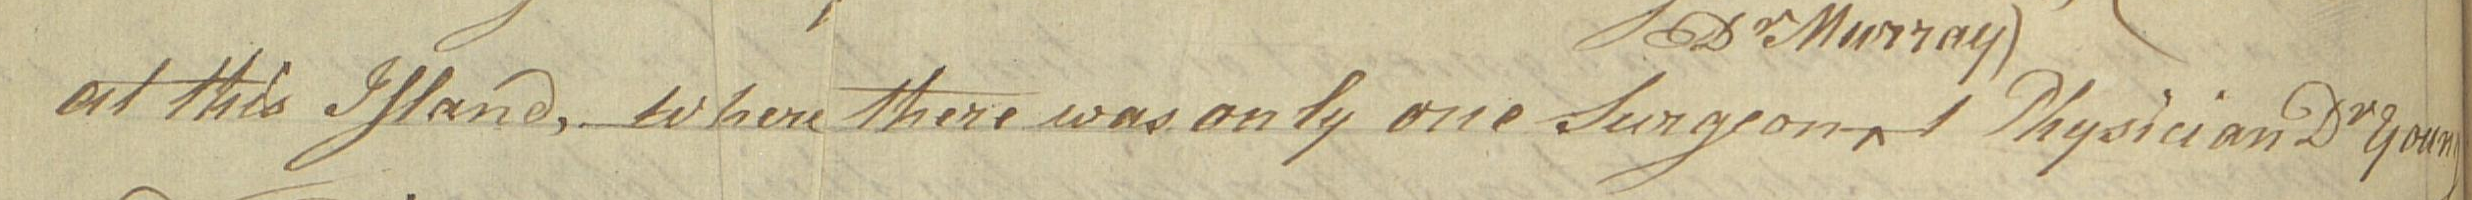at this Island, Where there was only one surgeon ^ Physician D^r Young
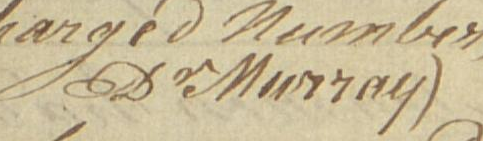D^r Murray)
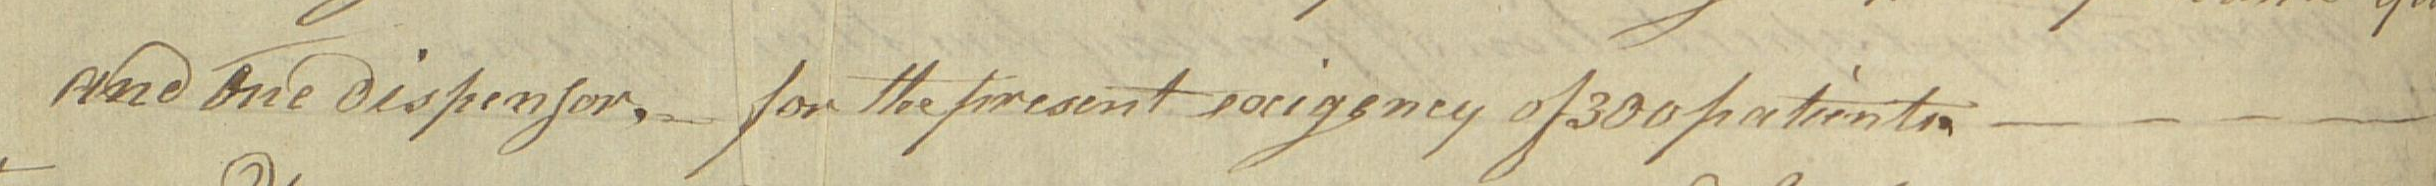and One dispensor, for the present exigency of 300 patients.
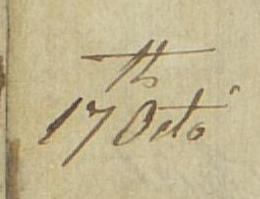17^th Octo^r
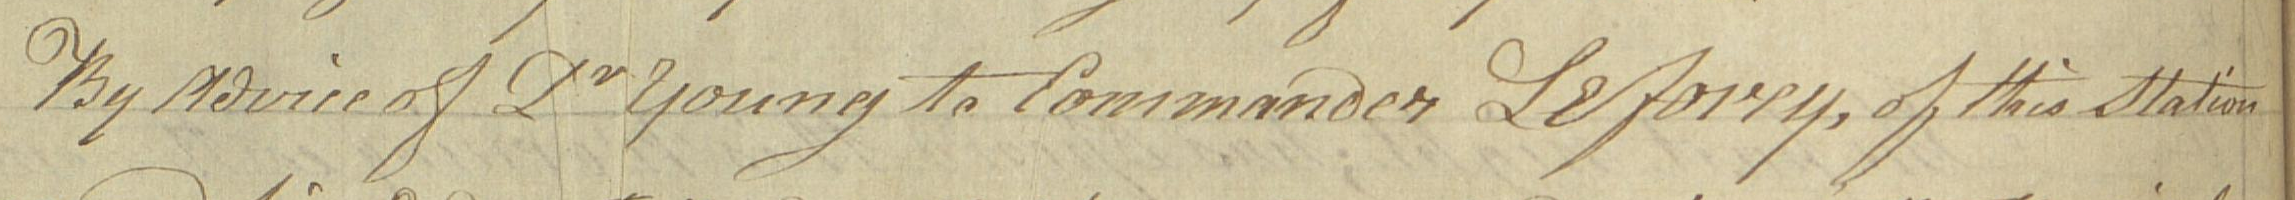By Advice of D^r. Young to Commander Leforey of this Station
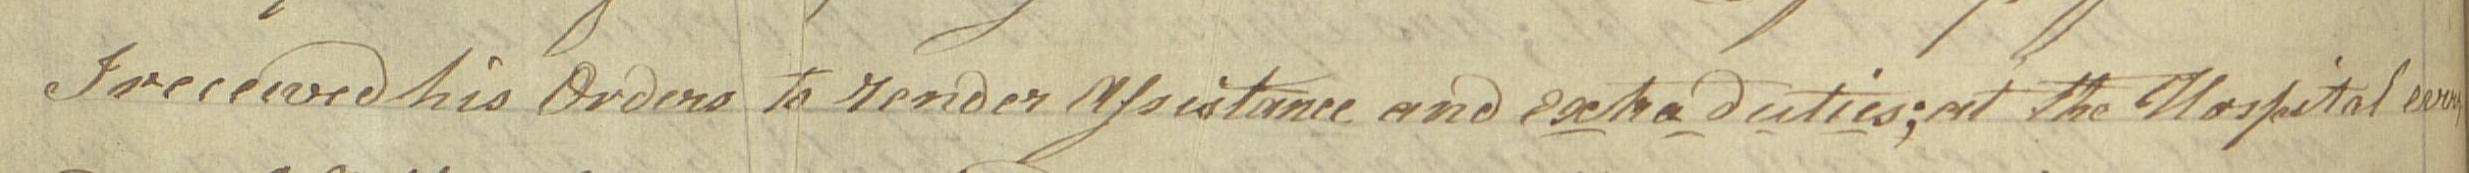I received his Orders to render Assistance and extra duties at the Hospital every
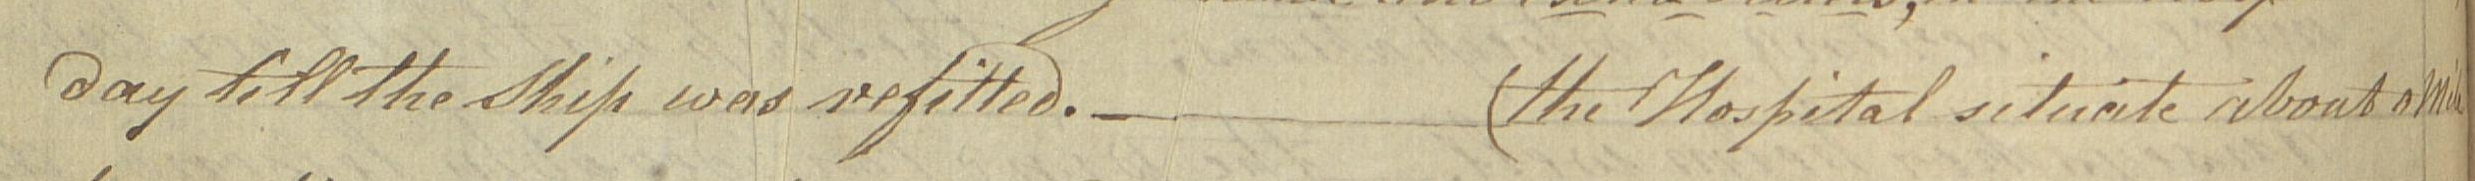day till the Ship was refitted. (the Hospital situate about a Mile
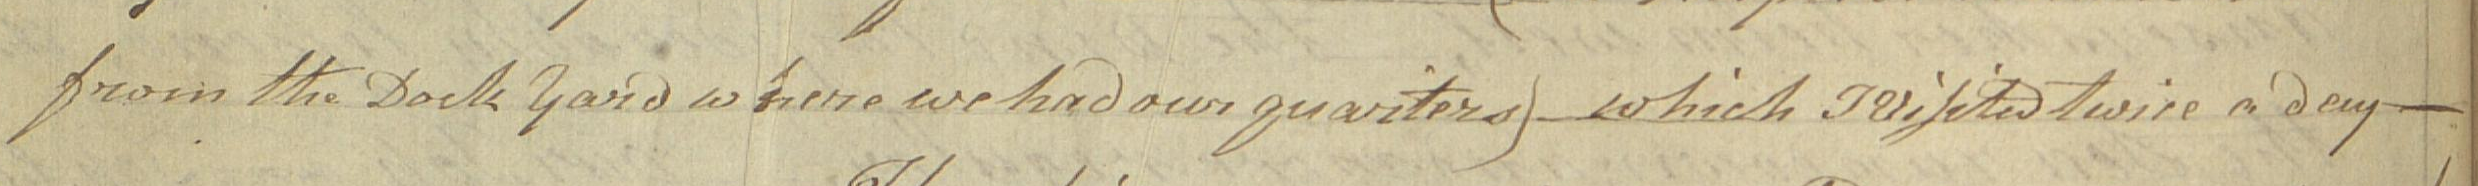from the Dock Yard where we had our quarters) which I visited twice a day
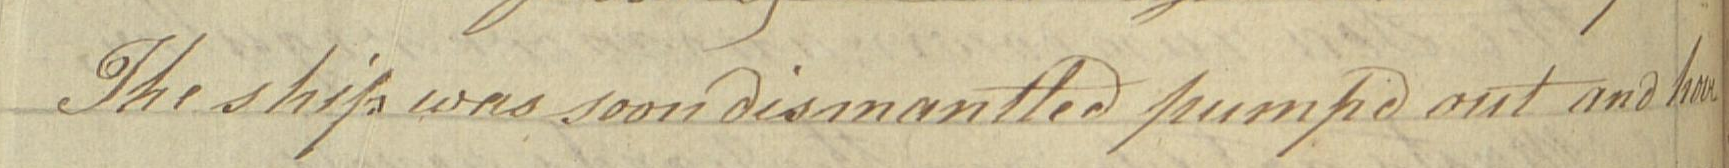The ship was soon dismantled pumpd out and hove
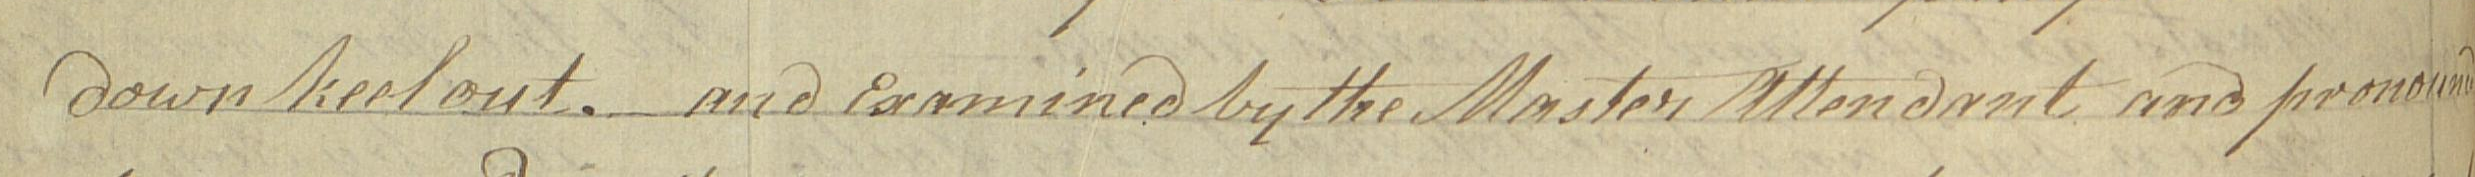down keel out. and Examined by the Master Attendant and pronounced
